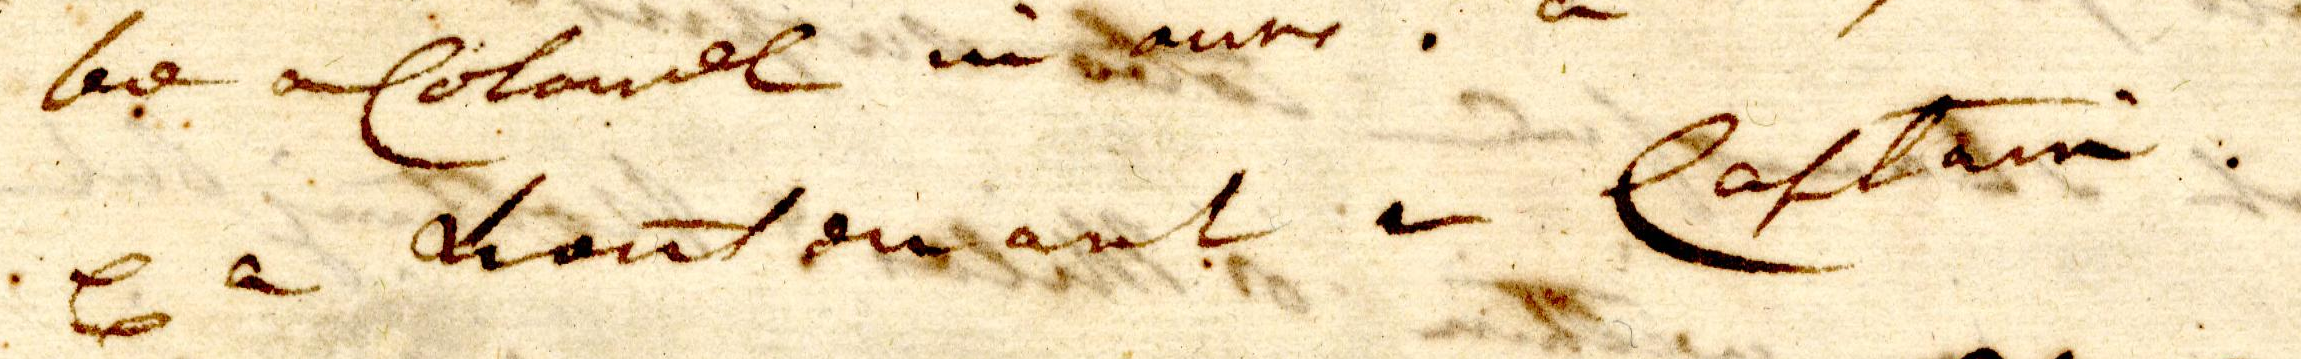& a Lieutenant a Captain.
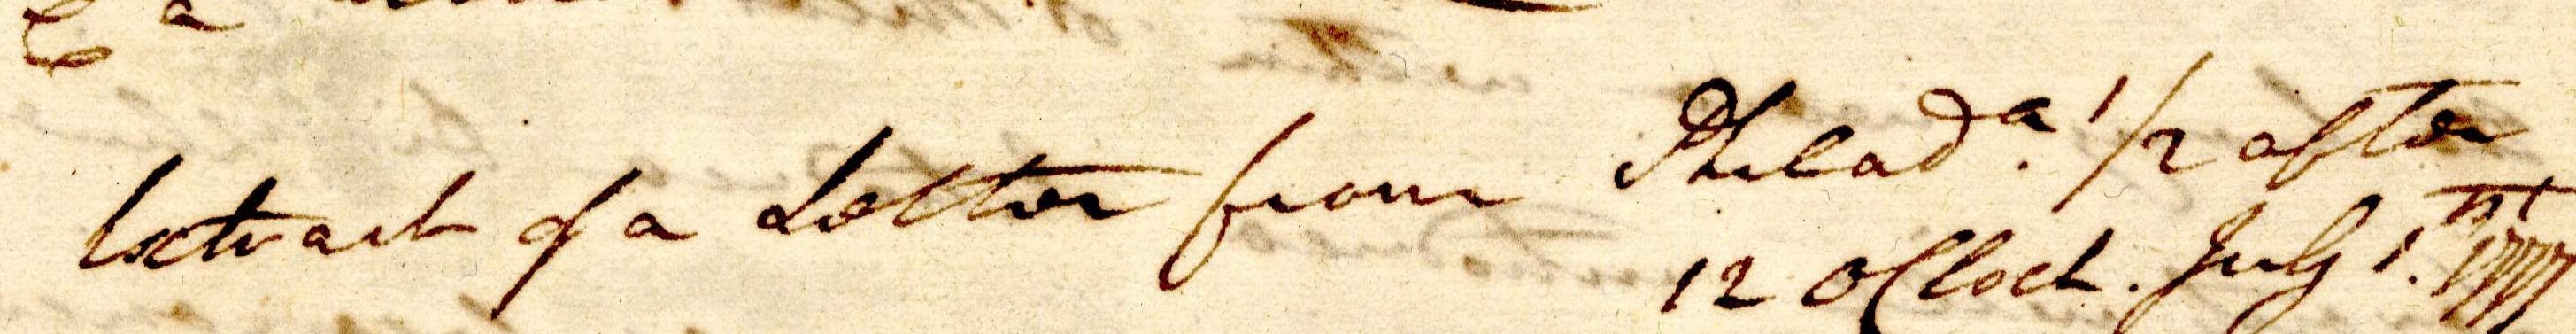Extract of a Letter from Philad^a. 1/2 after
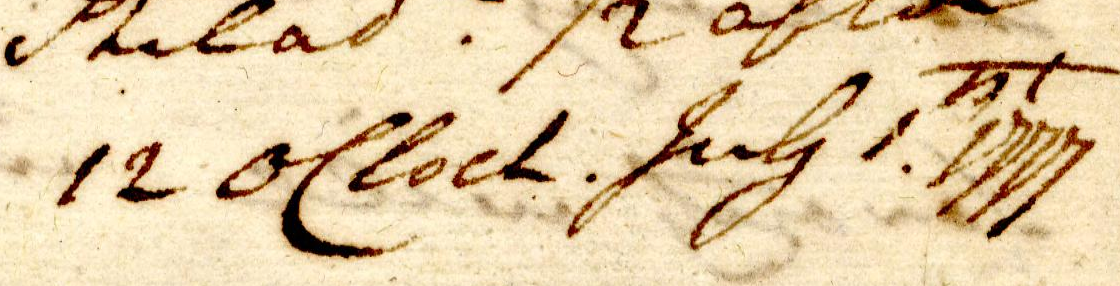12 oClock. July 1^st. 1777
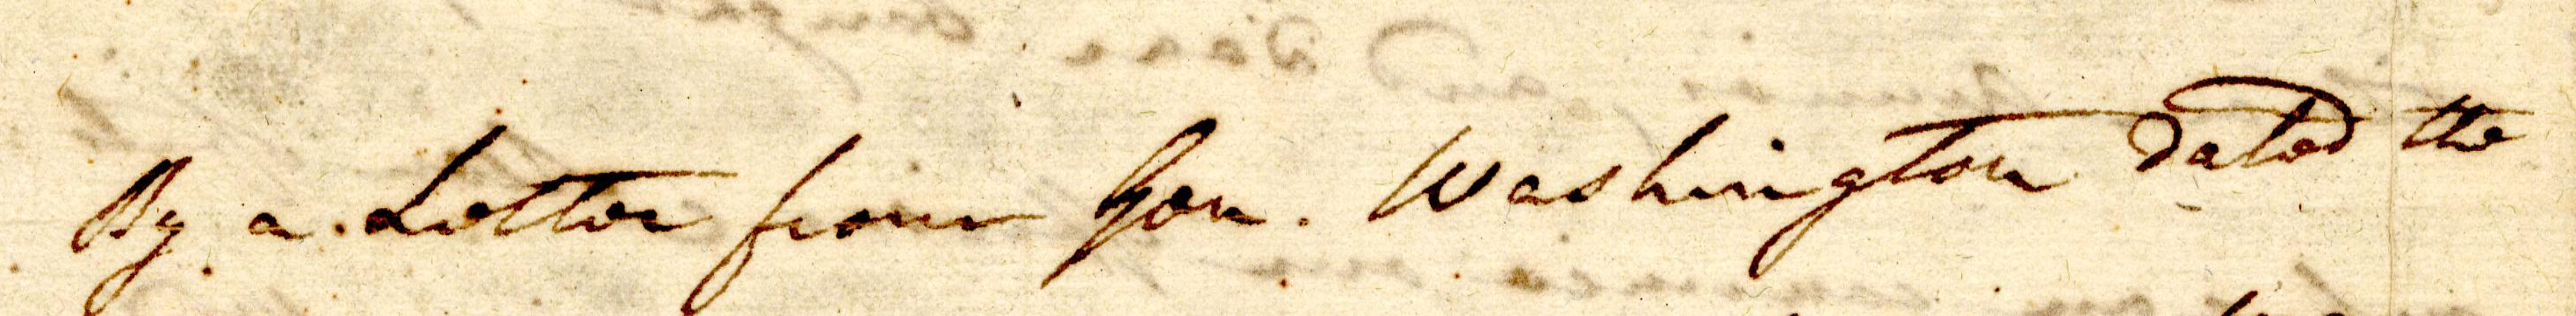by a Letter from Gen. Washington dated the
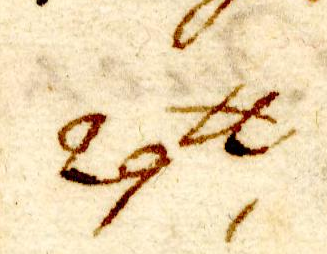29^th
